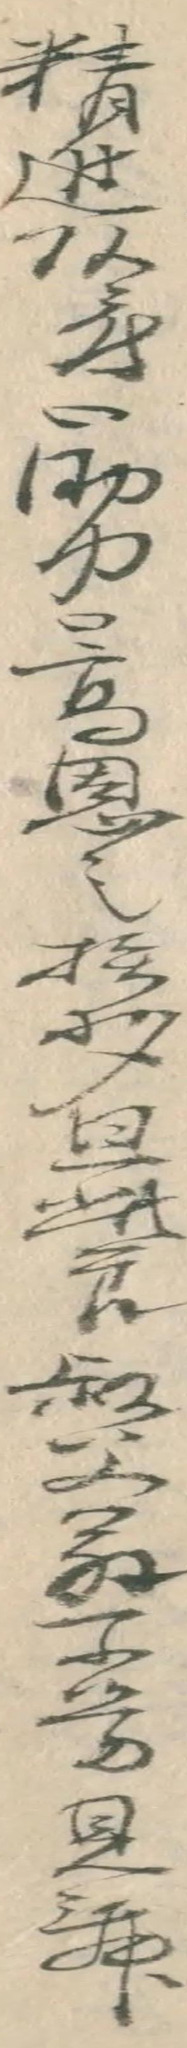精進頂ニ付御助力御高恩之挨拶且此節叔父翁所労見舞
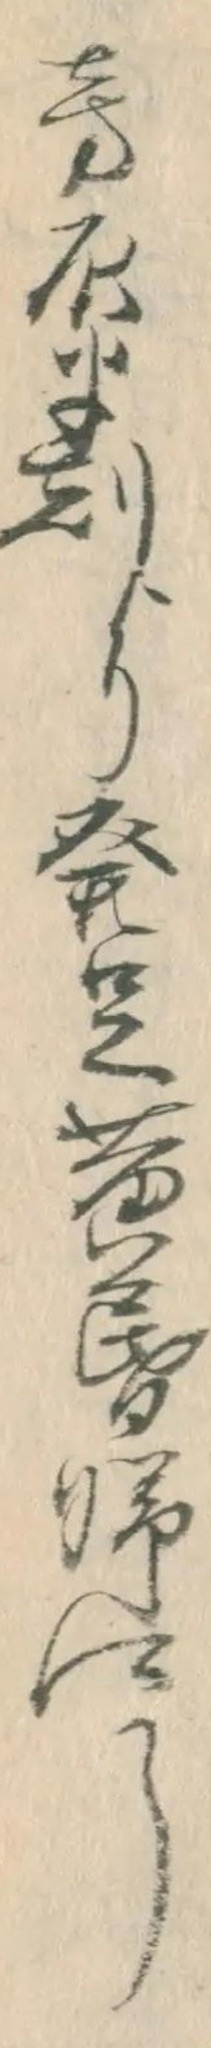旁辰半刻より発足黄昏帰郷了

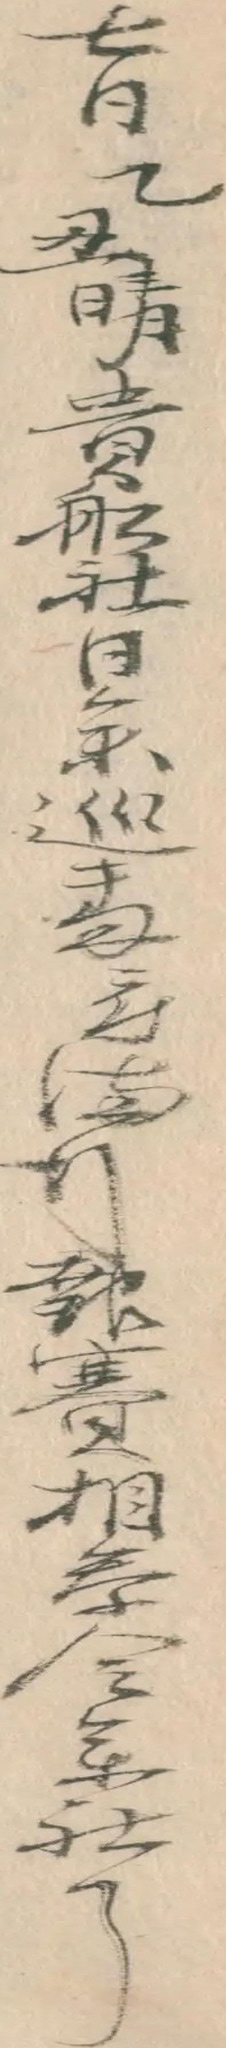七日乙丑晴貴舩社日参巡番ニ付満行報賽相参合参社了
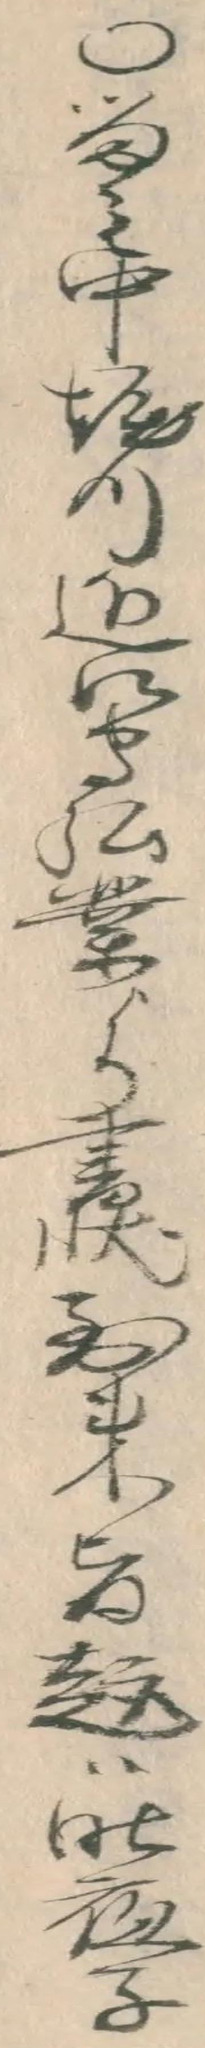○留主中堀川近江守弘業より書状到来旨趣ハ昨夜子
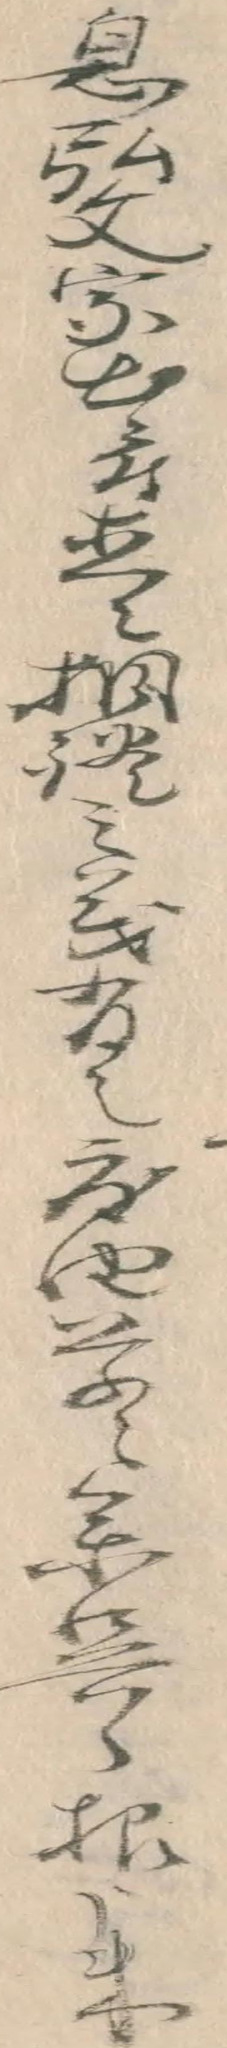息弘文家出ニ付直々相談之義有之度由草々参呉候様申来
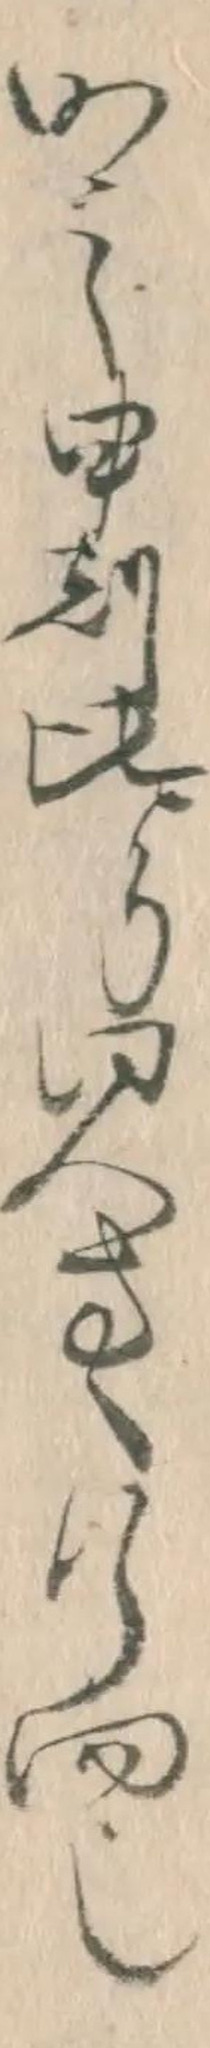町之申刻比より同人方へ行向也
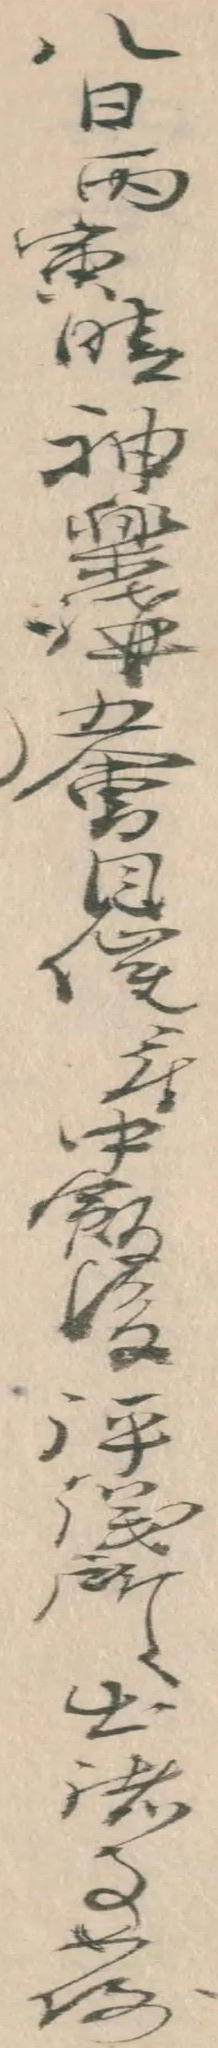八日丙寅晴神楽講五會目催ニ付中飯後評議所へ出諸事如例
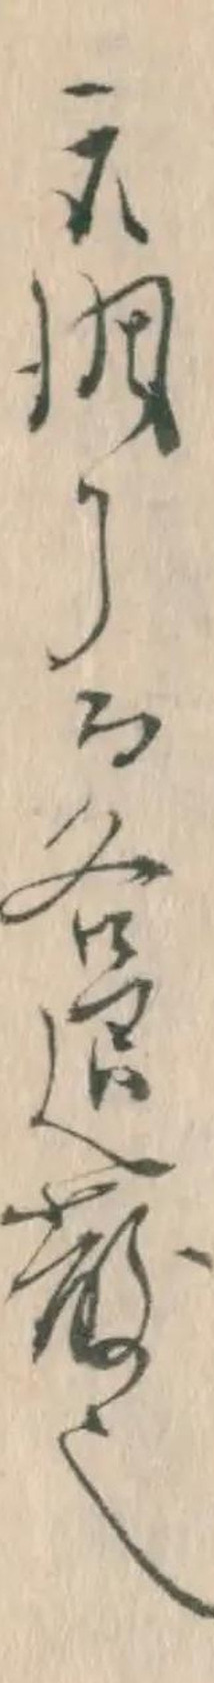取調了而各退散也
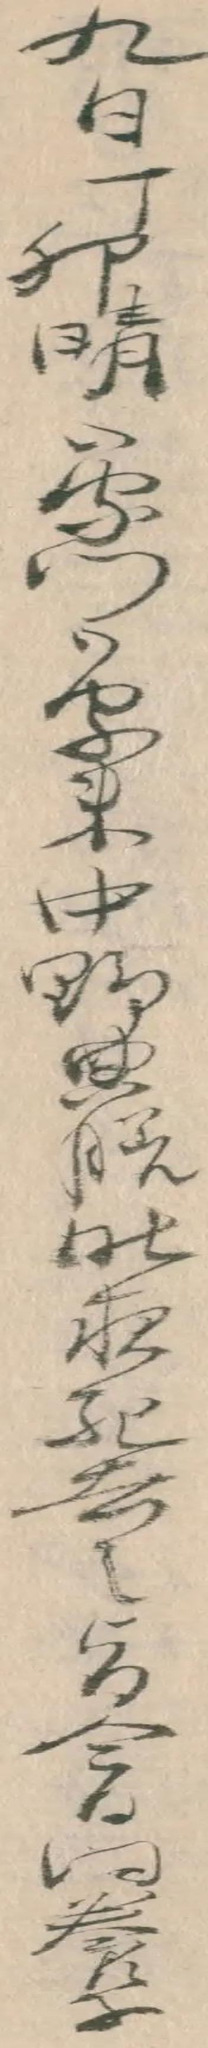九日丁卯晴御家門御家来中野典膳昨夜死去之旨今日同養子
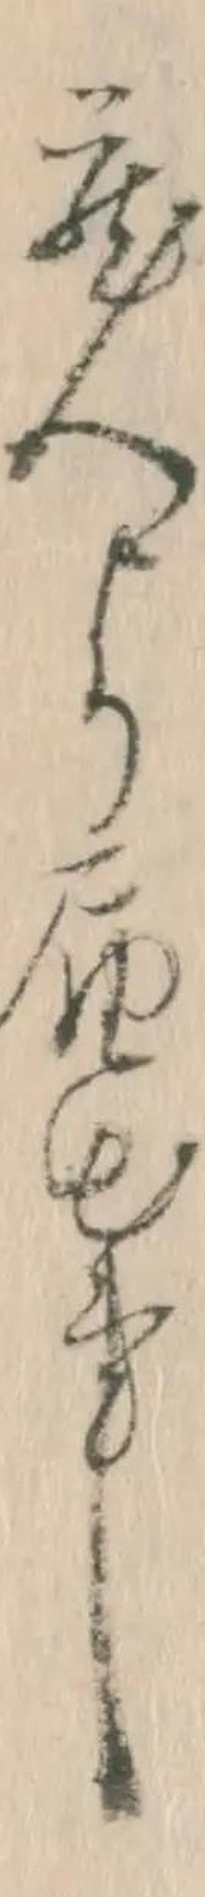蔵人より届出事
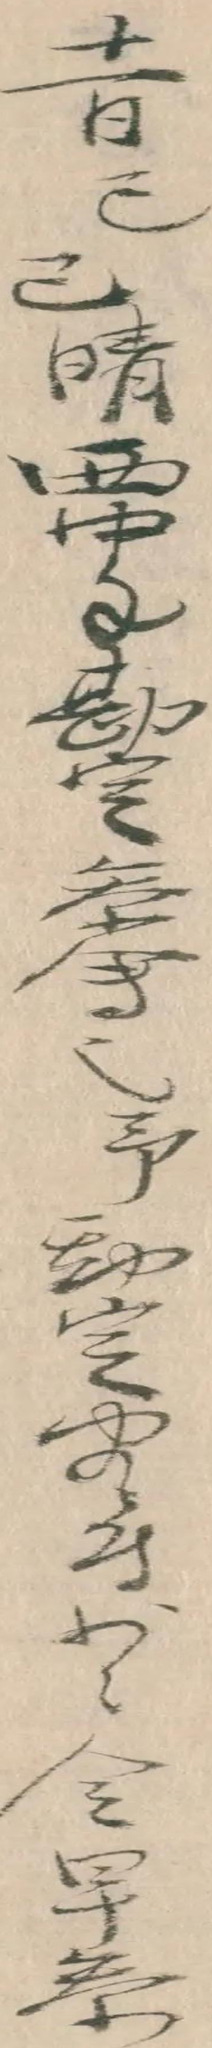十一日己巳晴西中手勘定参會也予勘定申候付少々令早参
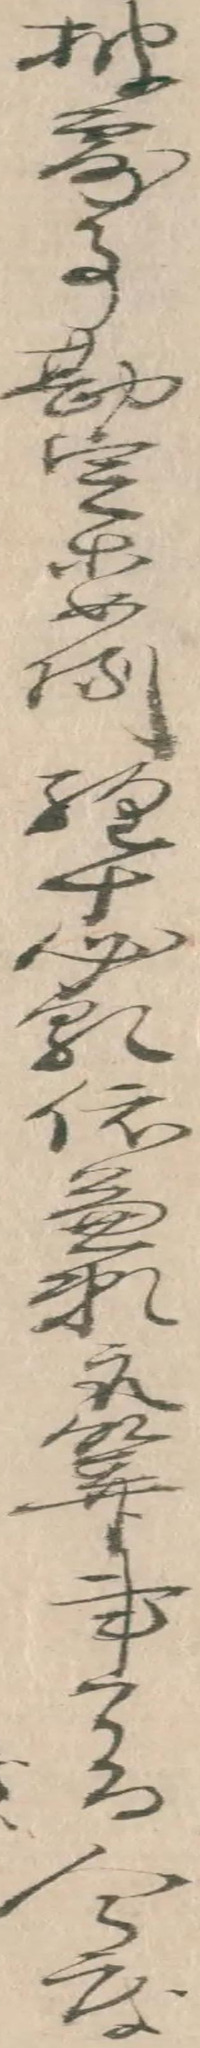披露事勘定等如例経千必顕依兼頼取算候事了而今度
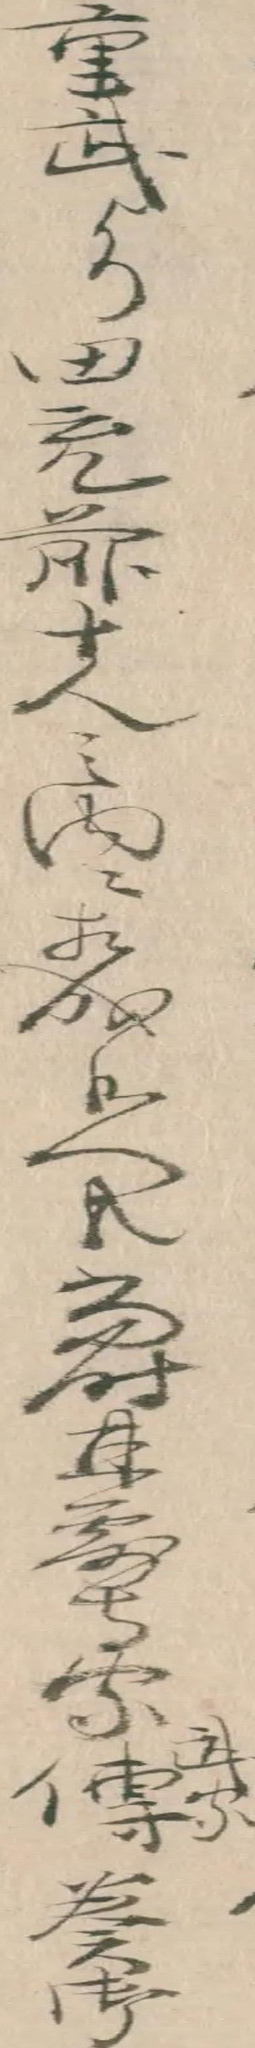重武より田充前十人之内に相成候へ共當時甘露寺家武家傳奏御
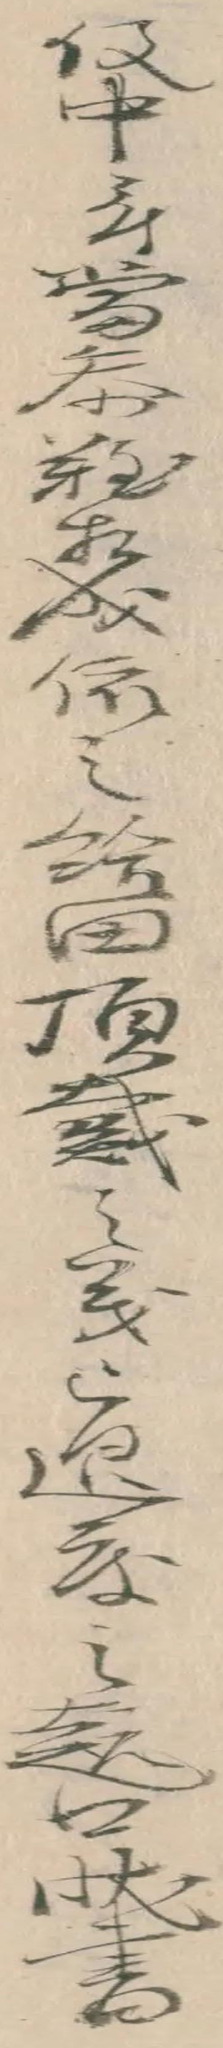役中ニ付當参難相成依之給田頂戴之義被退度之趣御状書
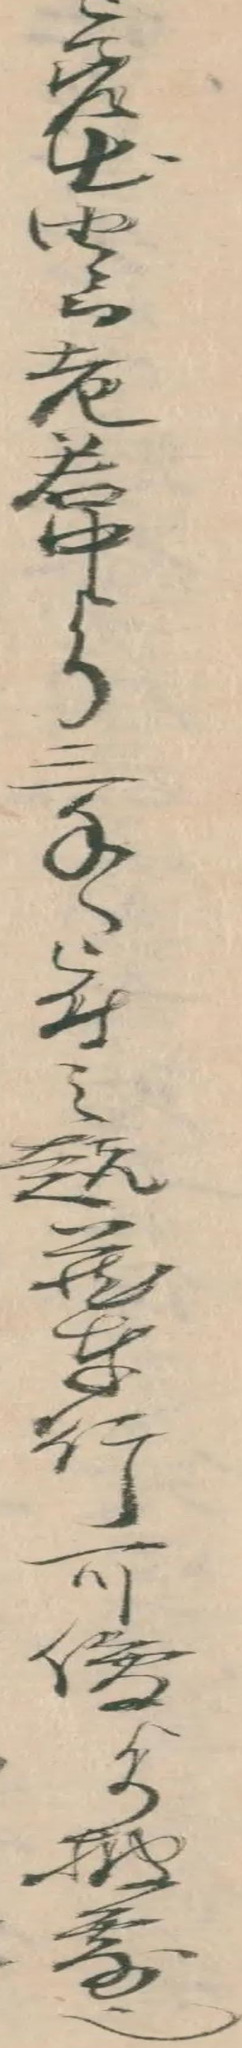被差出由ニ而老若中より三手へ被付之趣蔵奉行可被仰より披露也
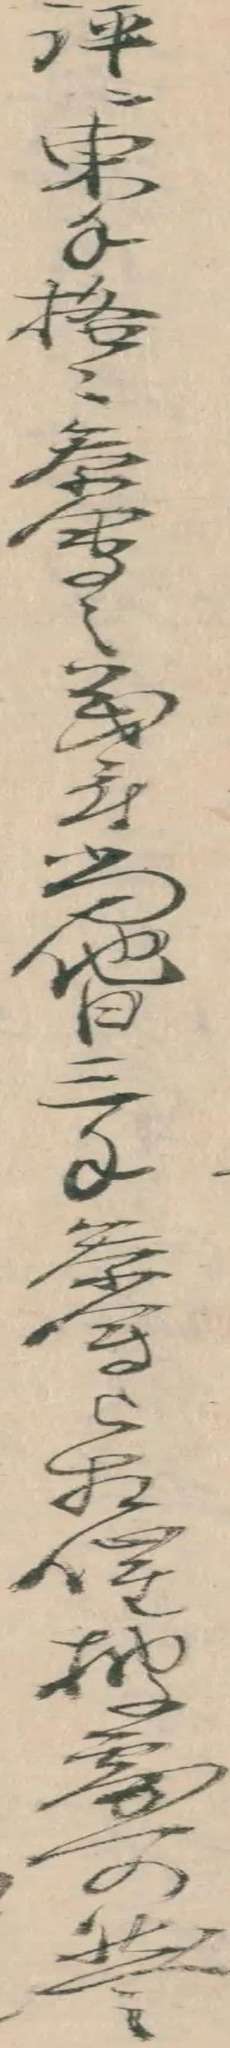評ニ東手格々参會之義ニ付當他日三手参會被相催披露可然之
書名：賀茂社記録. 第65冊
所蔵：国立国会図書館 National Diet Library, JAPAN
